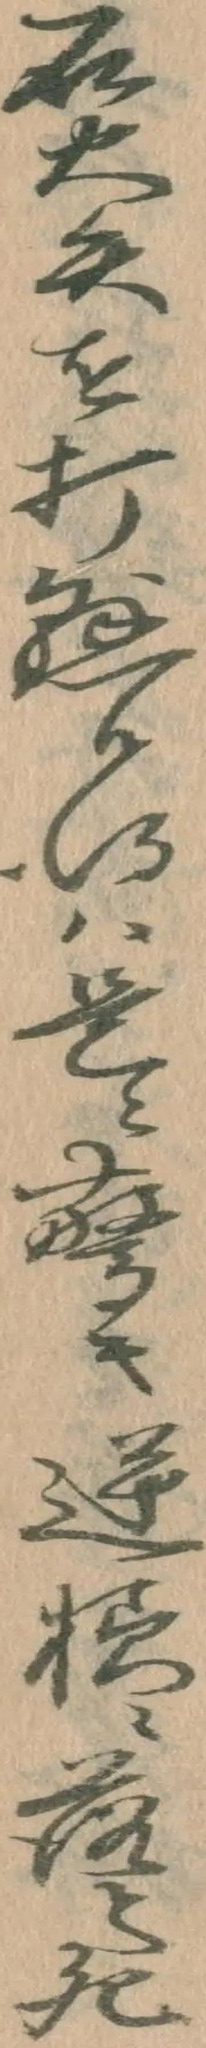石火矢を打懸候得は是に驚き逆様に落て死
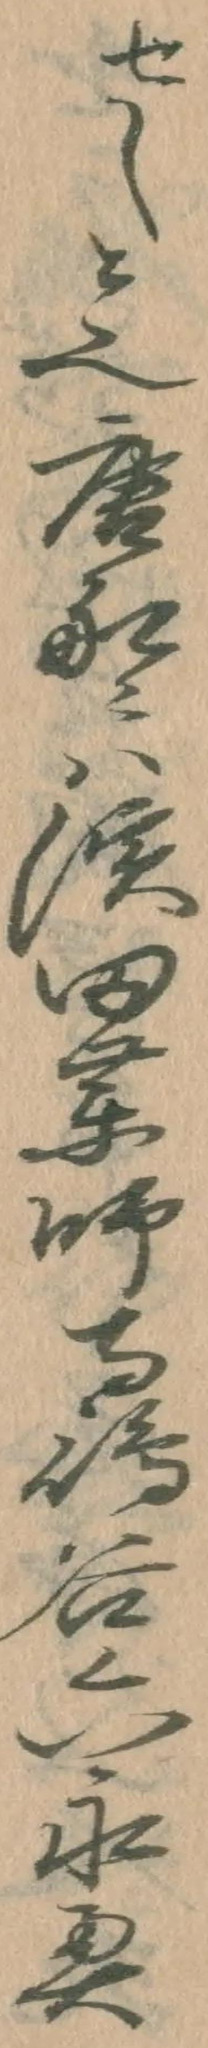せしと也唐船には浜田乗師寺島谷六永奥
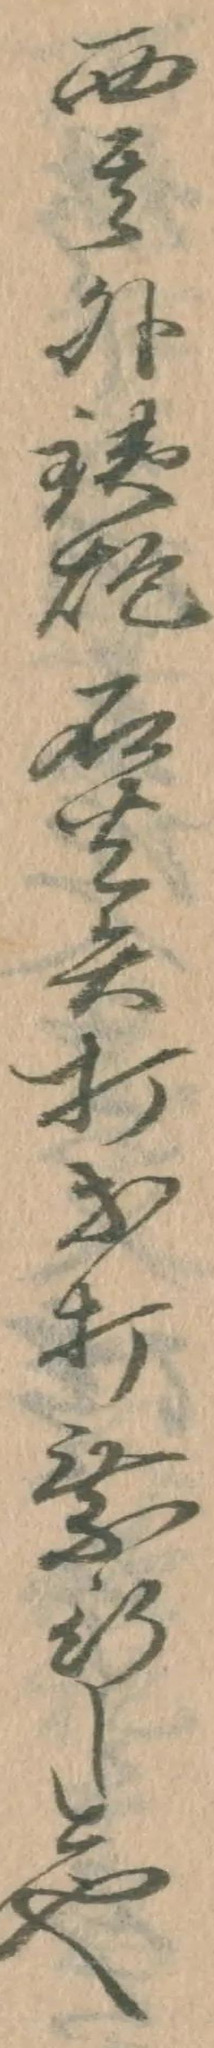西其外鉄砲石火矢打等打乗行しと也
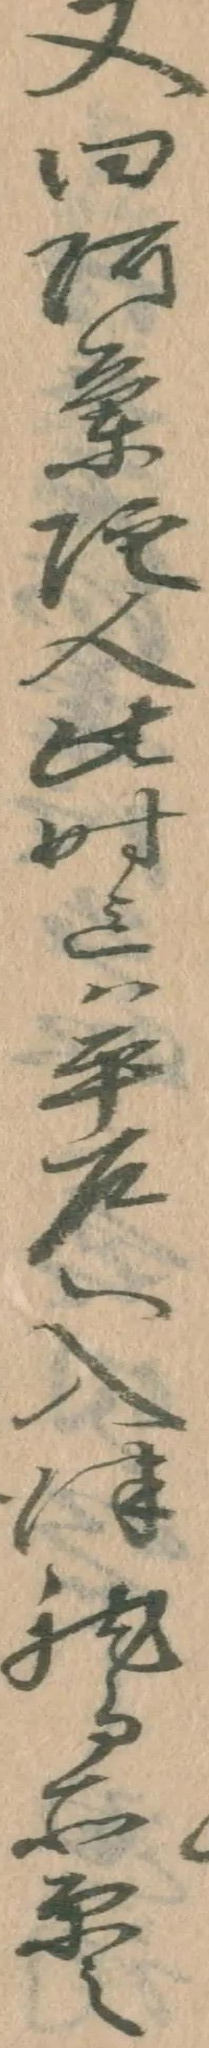又曰阿蘭陀人此時迄は平戸へ入津然る所原之
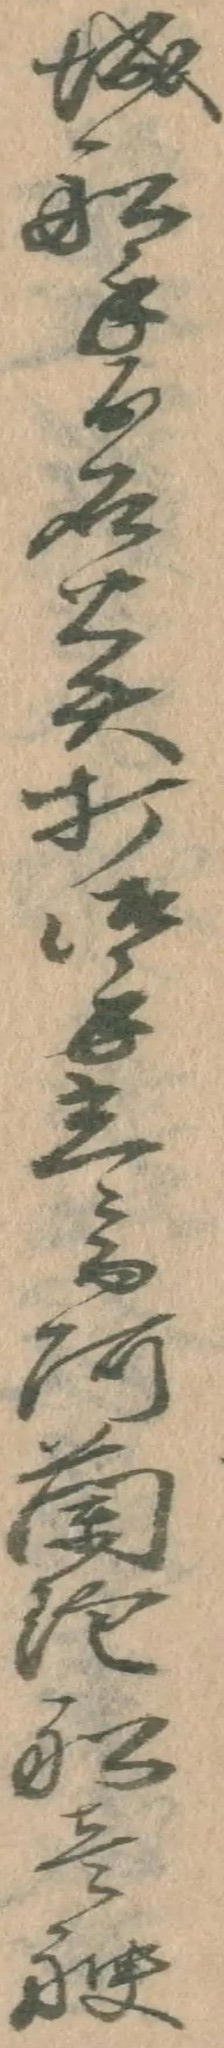城舩手ゟ石火矢打御手立に而阿蘭陀舩壱艘
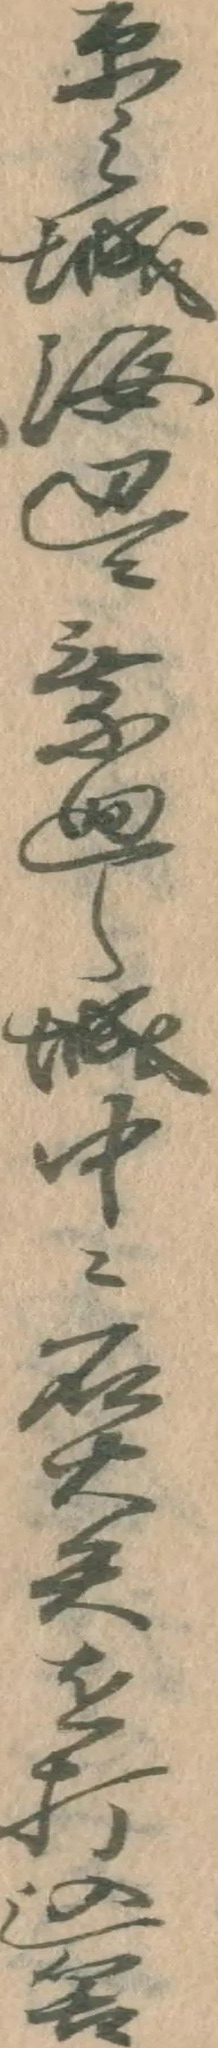原之城海辺に乗廻し城中に石火矢を打込筈
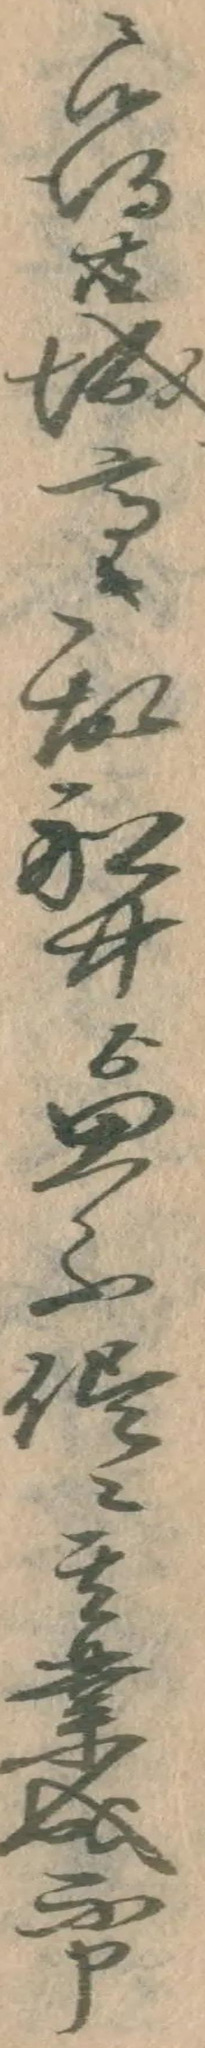に候得共城高き故舩中ゟ思ふ侭に其業成ふ申
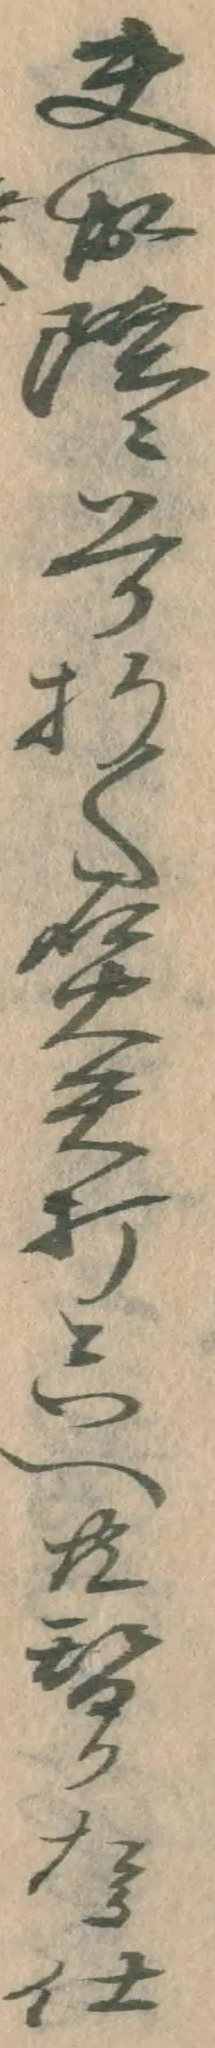夫故陸に上り折々石火矢打といへ共替りたる仕
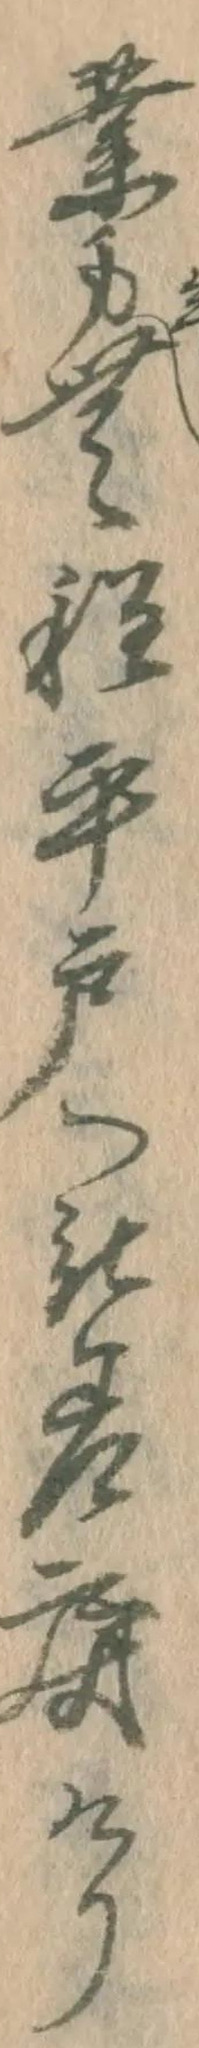業も無程平戸へ被着戻けり
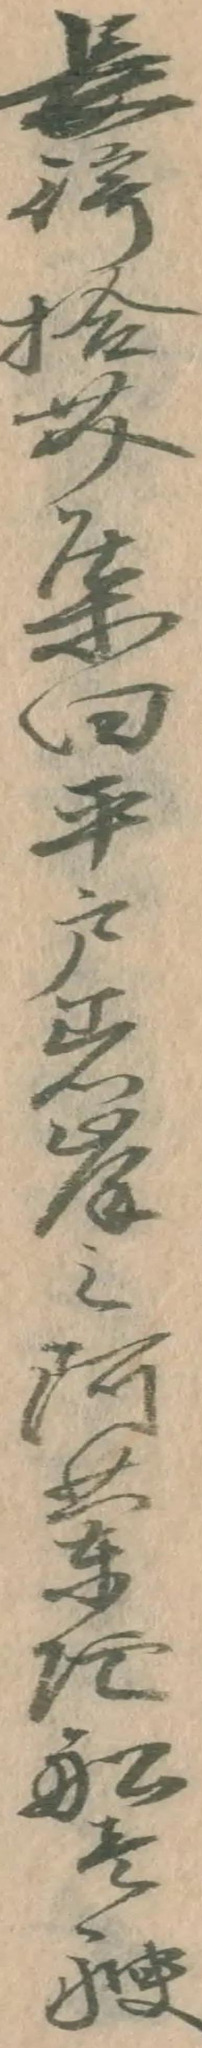長崎拾芥集曰平戸着岸之阿蘭陀舩壱艘
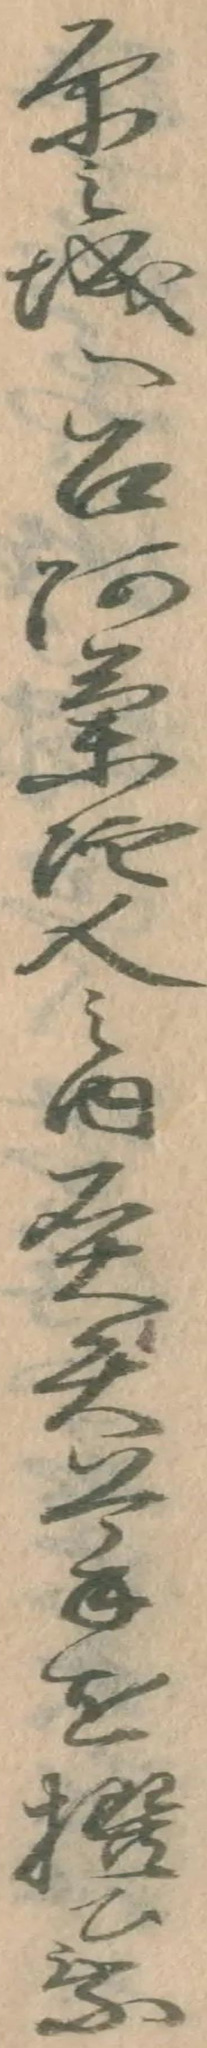原之城へ召阿蘭陀人之内石火矢上手を撰ひ乗

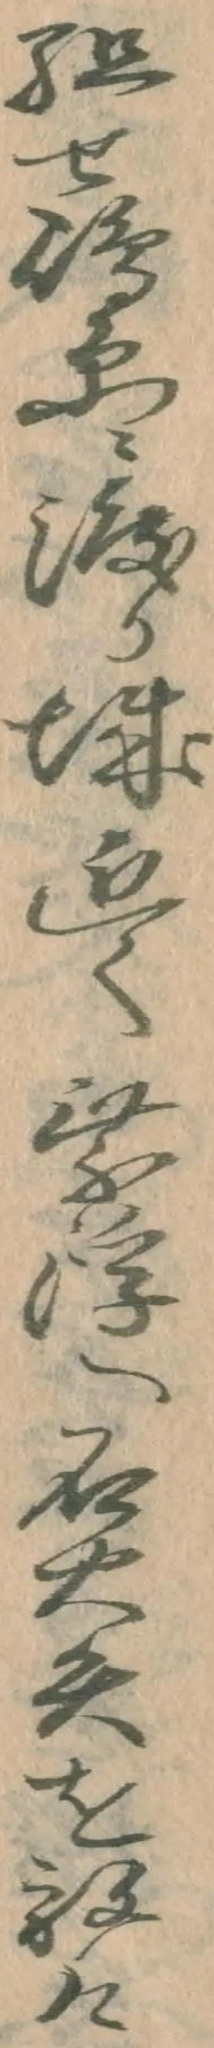組せ島原に渡り城近く乗浮へ石火矢を放け
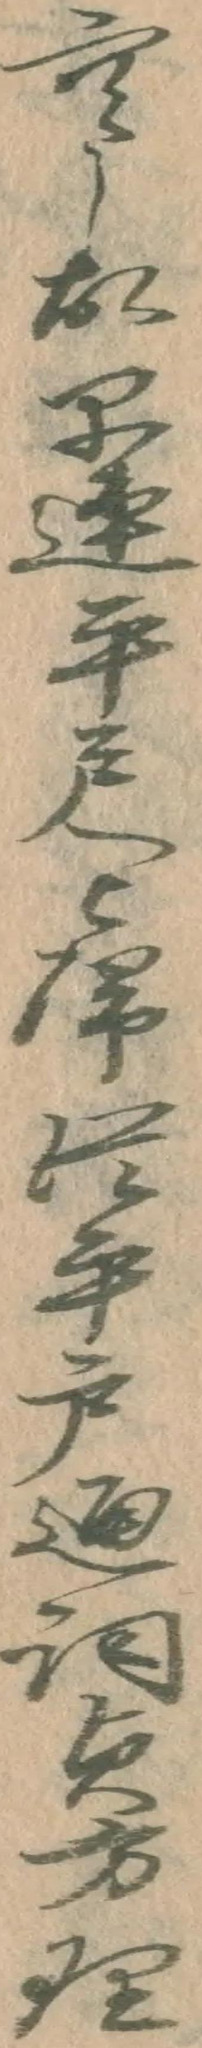空し故早速平戸へ被帰従平戸通詞貞方理
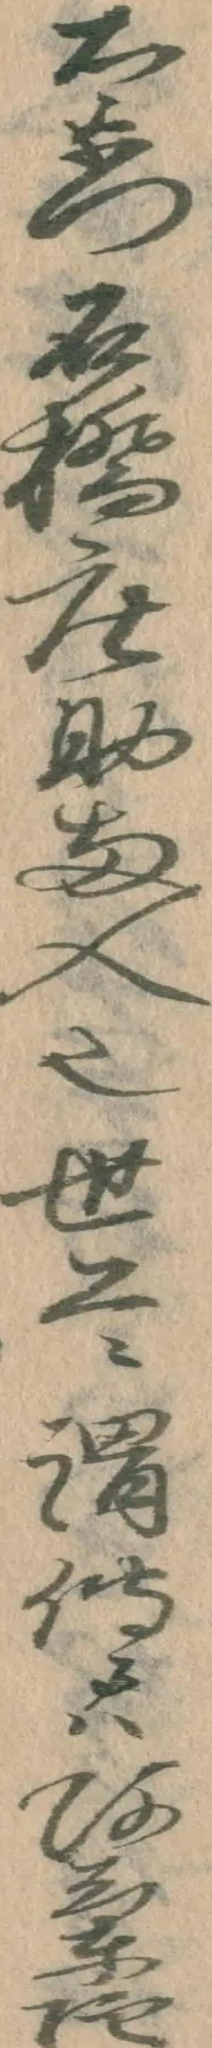右衛門石橋庄助両人也世上に謂伝而は阿蘭陀
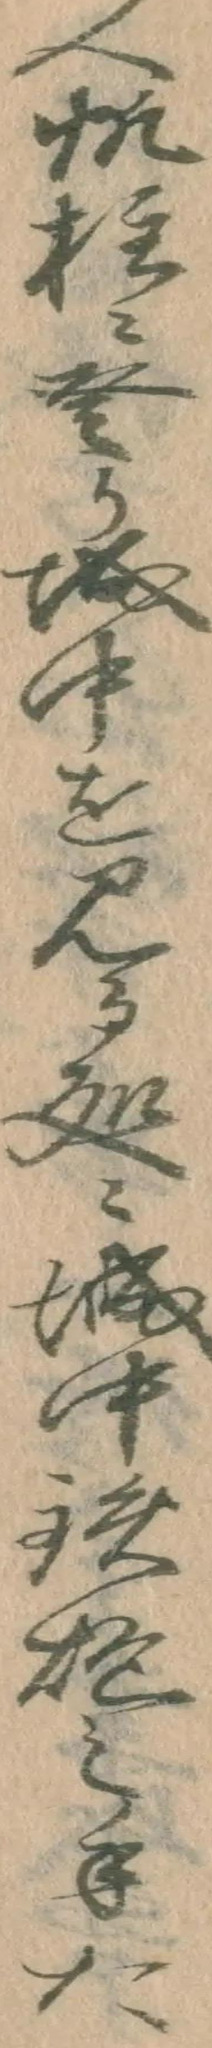人帆柱に登り城中を見る処に城中鉄砲之手た
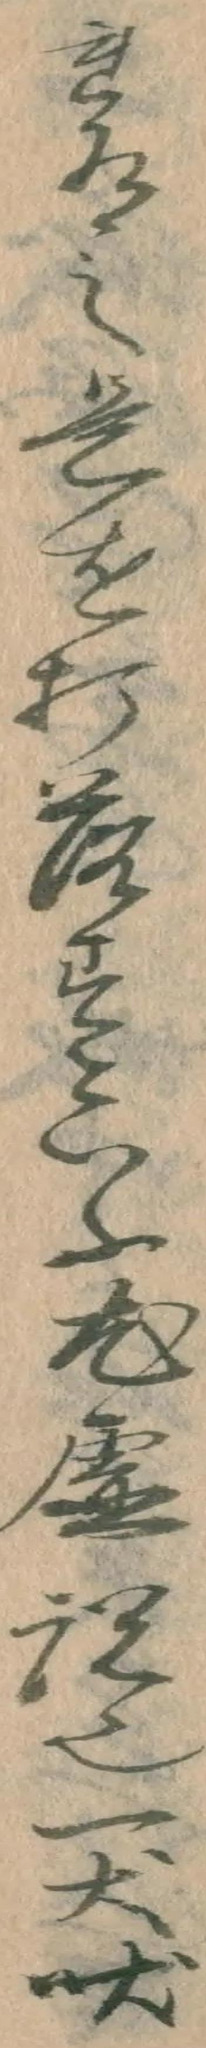連有之是を打落春といふ尤虚説也一犬吠
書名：切支丹御退治記 49巻. [5]
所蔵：国立国会図書館 National Diet Library, JAPAN
